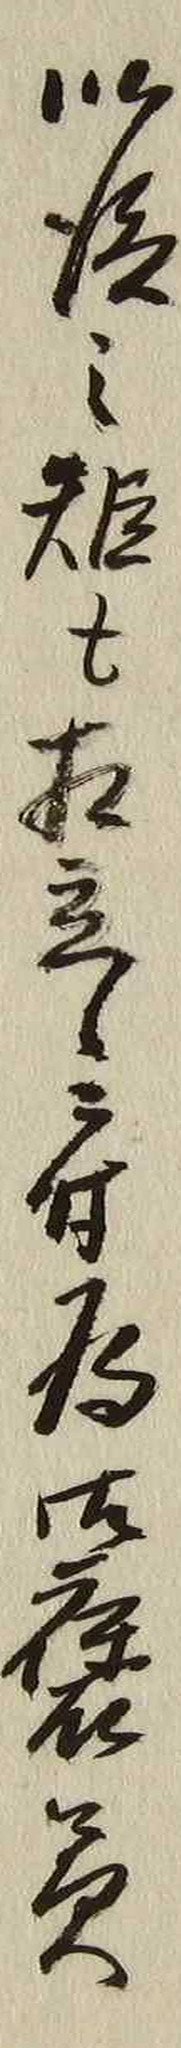以後之矩も相立候ニ付為御褒美
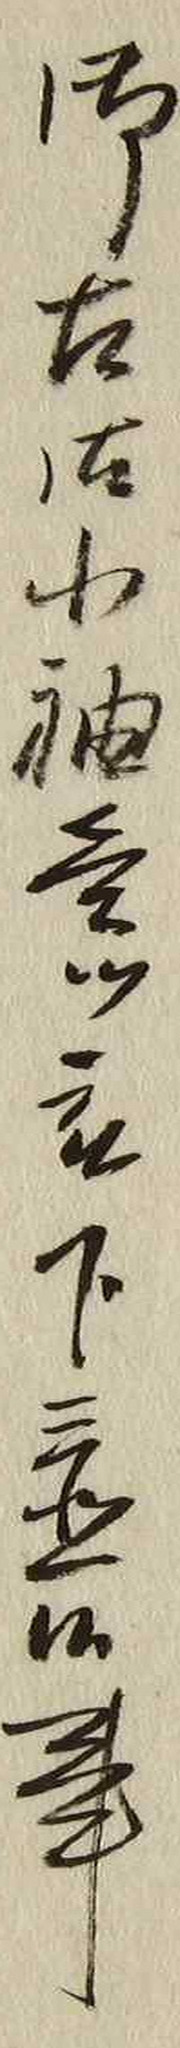御古御小袖壱ツ被下置候事
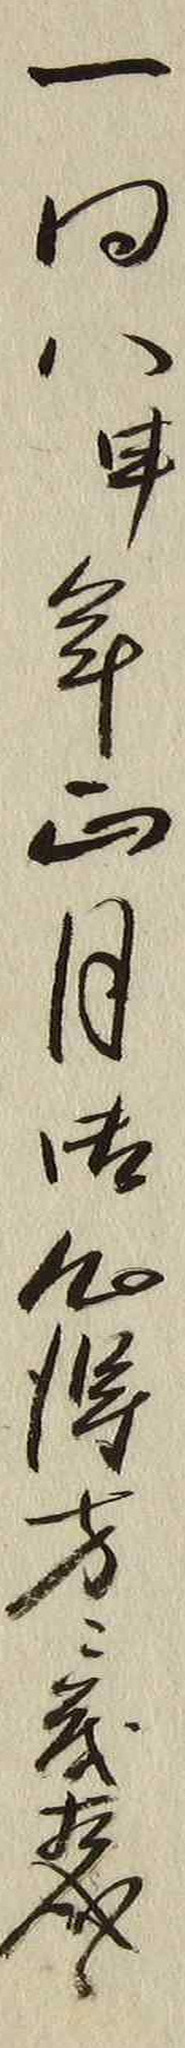一同八申年正月御心得方ニも相成候
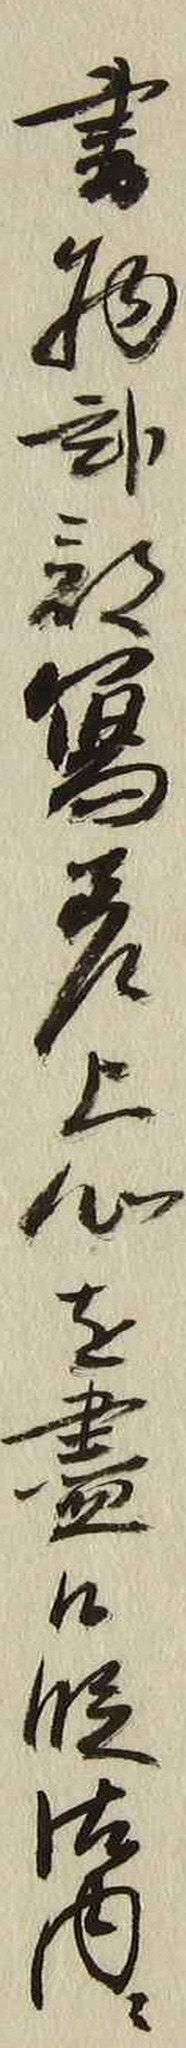書物弐部写差上心を尽候段御内ニ
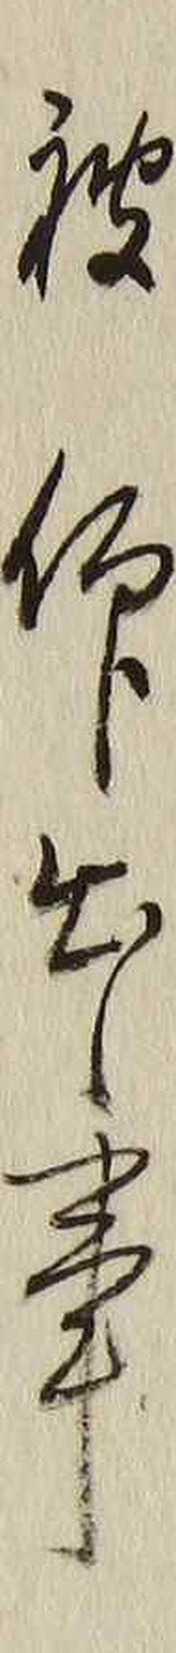被仰出候事
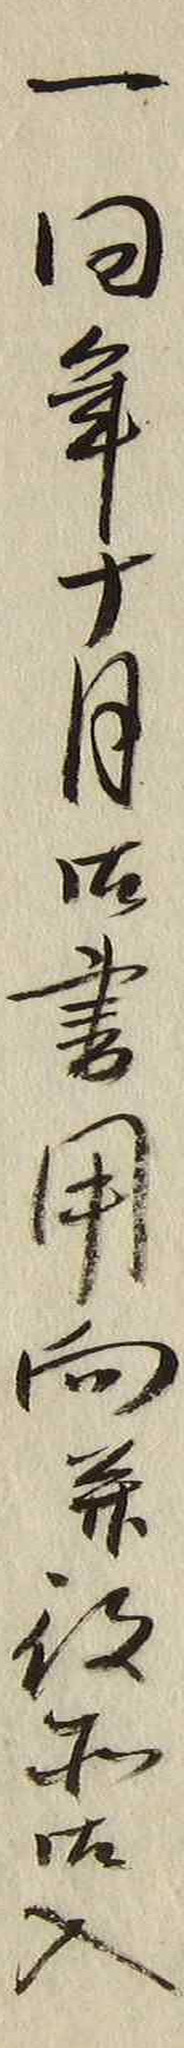一同年十月御書用向并役所御入
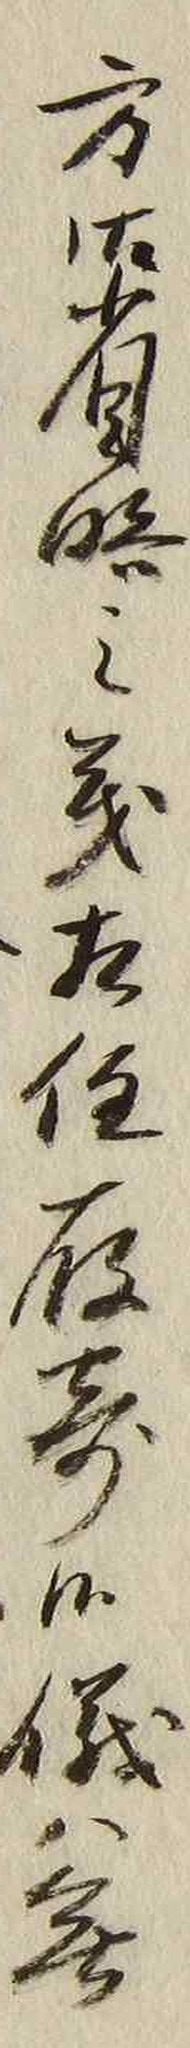方御省略之義相任存寄候儀ハ無
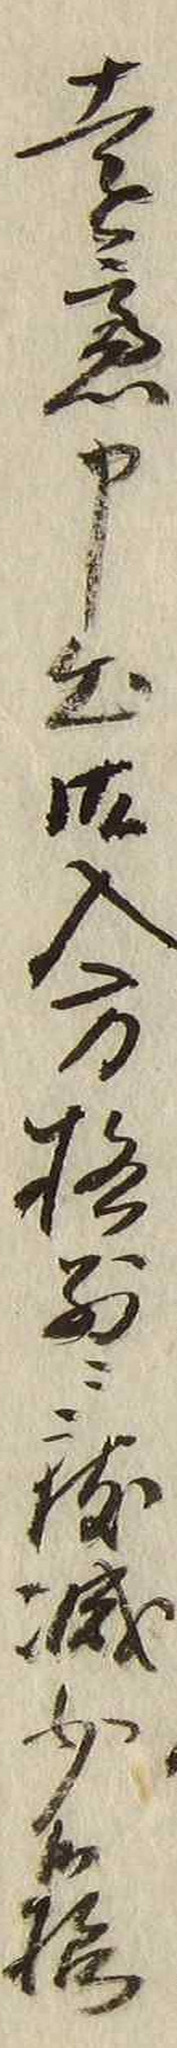遠慮申出御入方格別ニ致減少候様

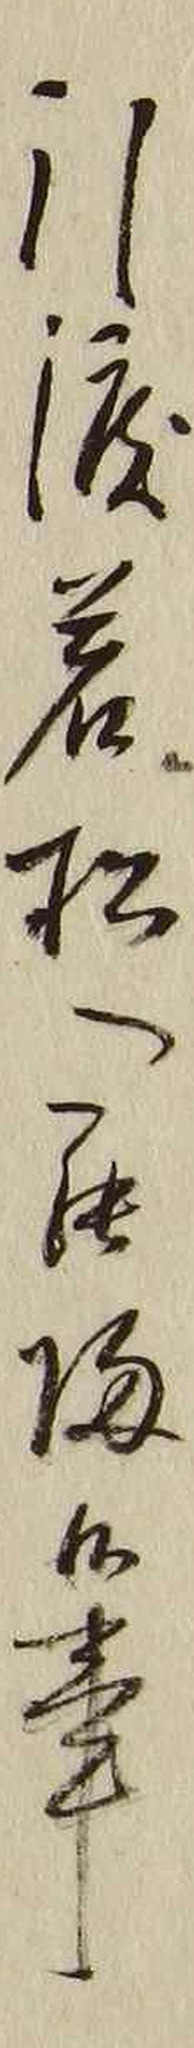引渡若松へ罷帰候事
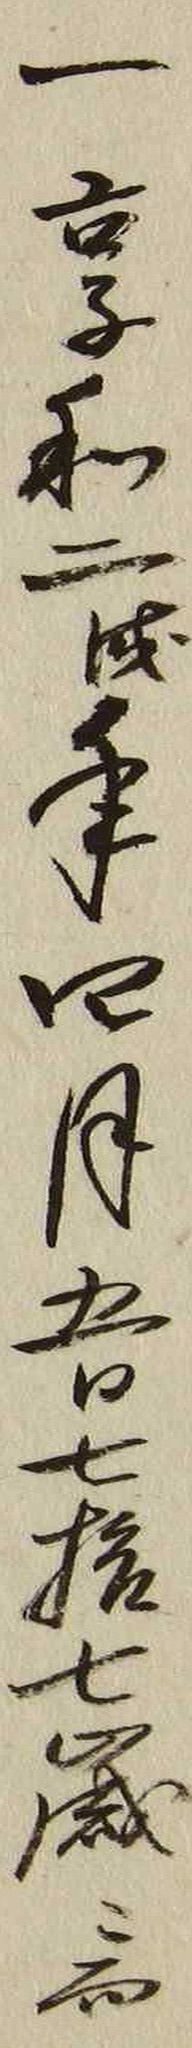一享和二戌年四月五日七拾七歳ニ而
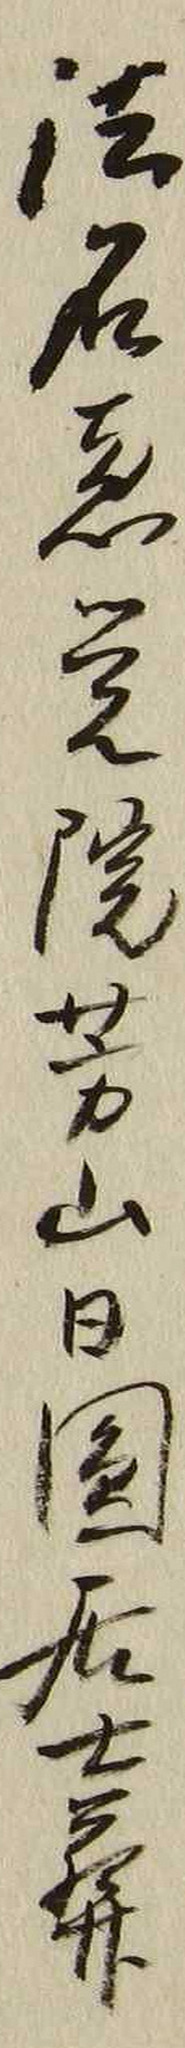法名恵覚院芳山日円居士葬
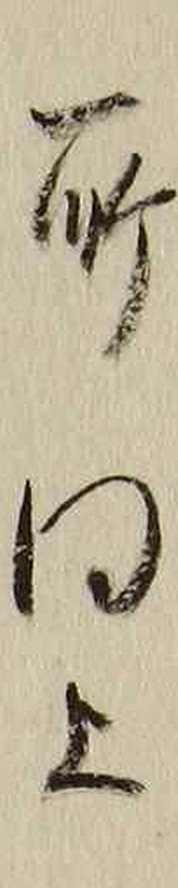所同上
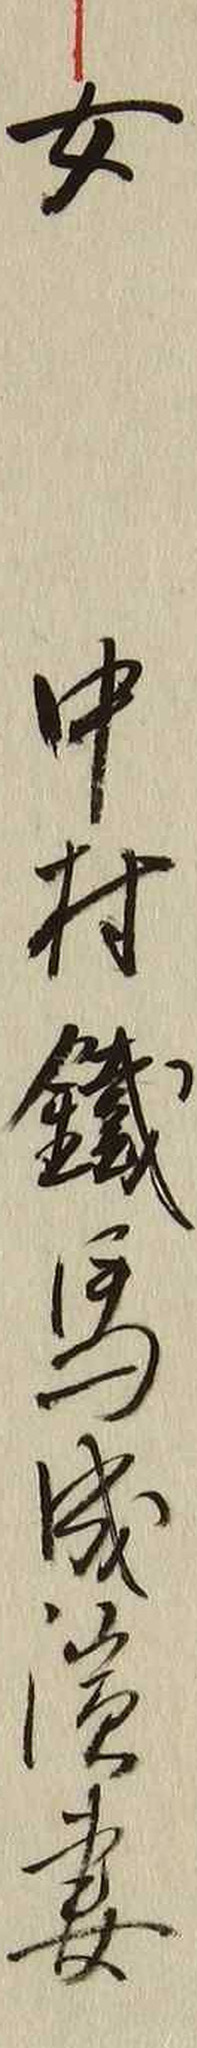女中村鉄馬成演妻
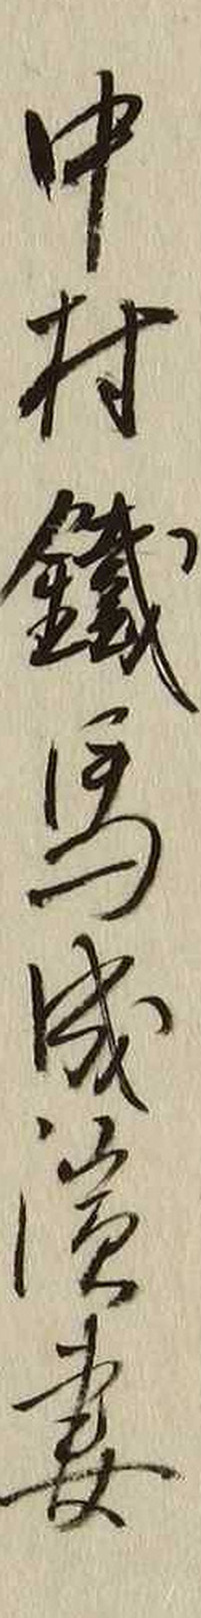女中村鉄馬成演妻
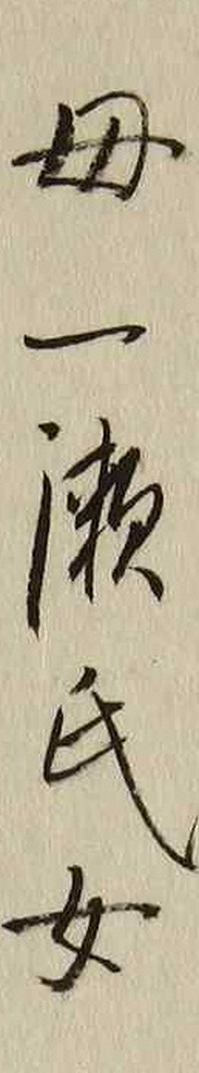母一瀬氏女
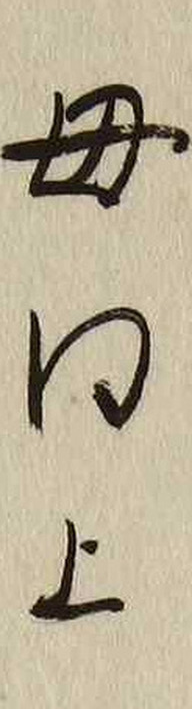母同上
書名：諸士系譜　巻之356　す之部6
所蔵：会津若松市立会津図書館
